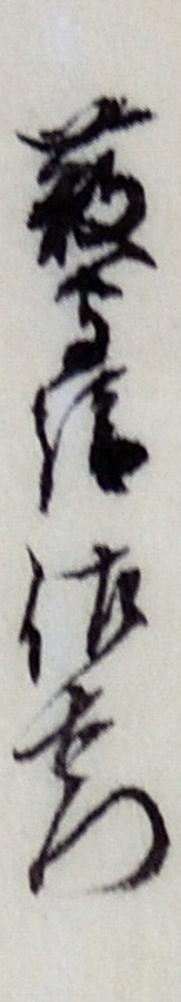藪守請佐右衛門
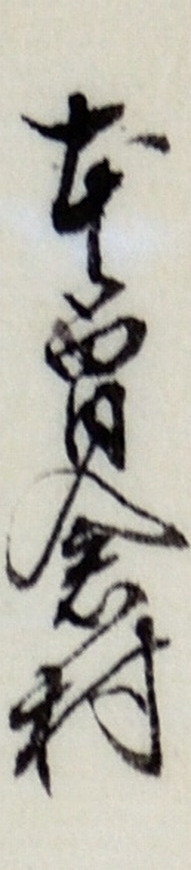本曽倉村
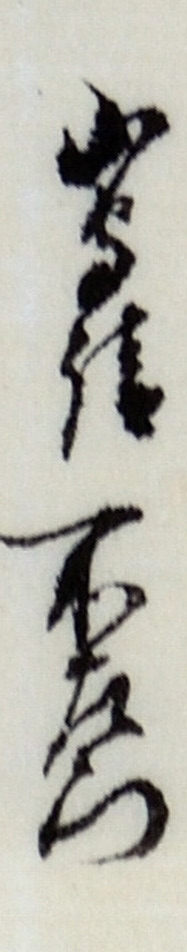山守請所左衛門
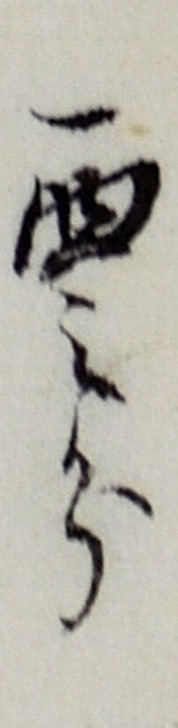東之分
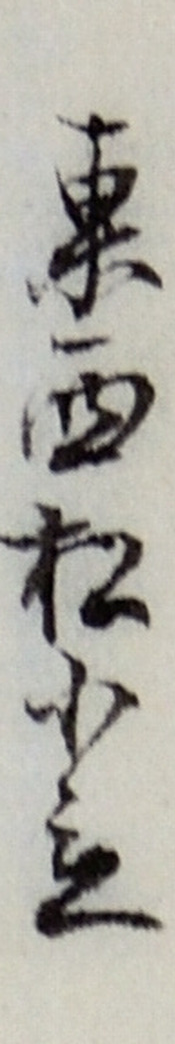東西松小立
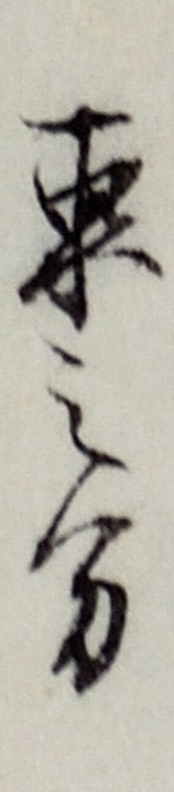東之分

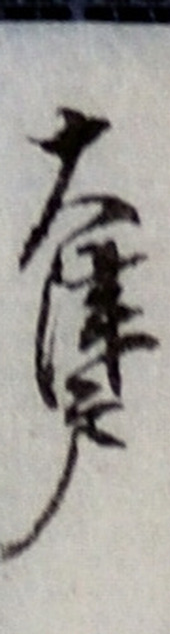大津戸
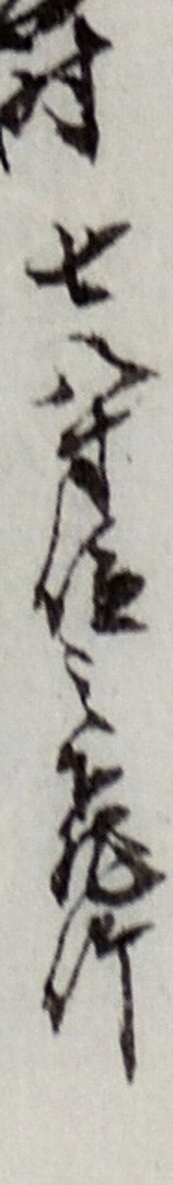当時七八寸位之飛竹
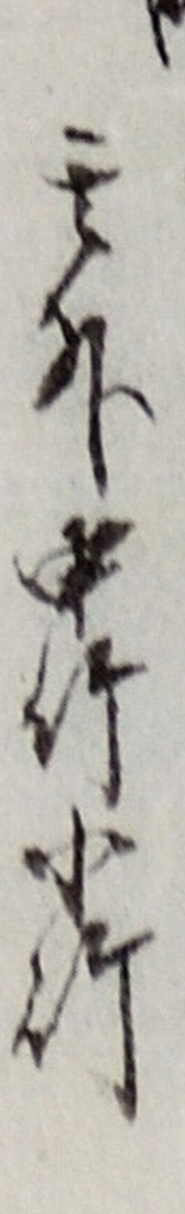其外中竹小竹
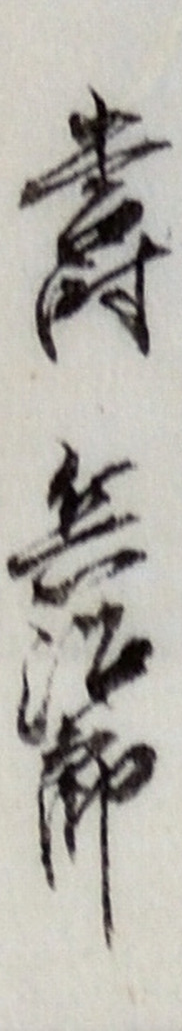当時兵治郎
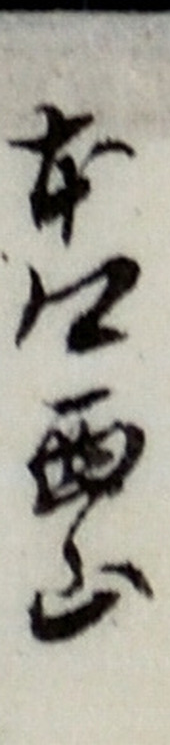本郷西山
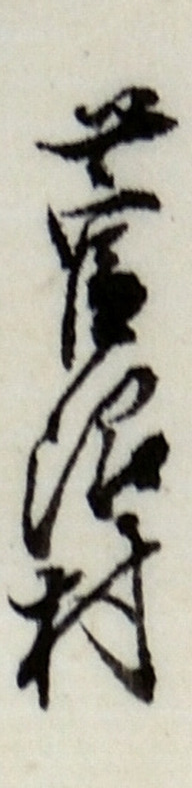菅沼村
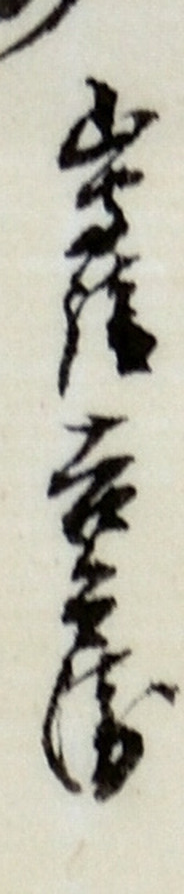山守請吉兵衛
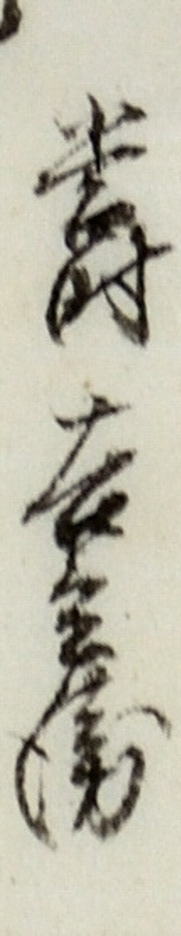当時吉兵衛
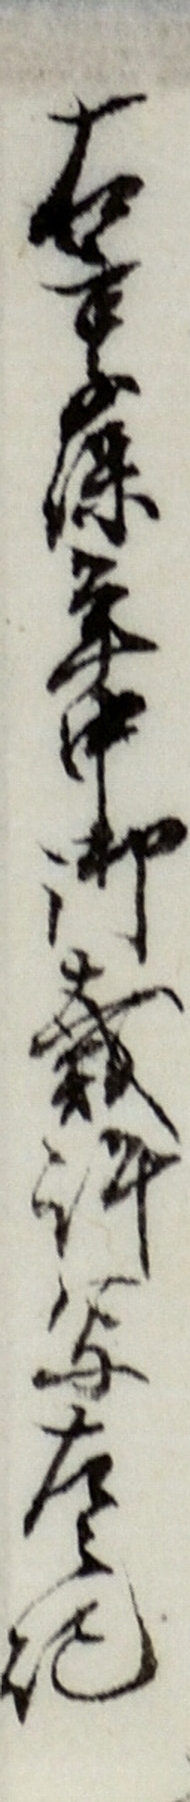右享保年中御裁許写左ニ記
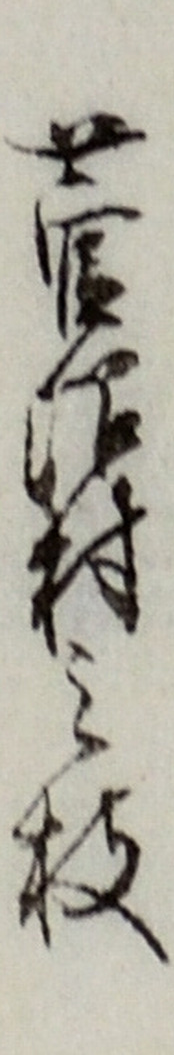菅沼村之枝
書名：山林帳草稿
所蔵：伊那市立高遠町図書館・合同会社AMANE
